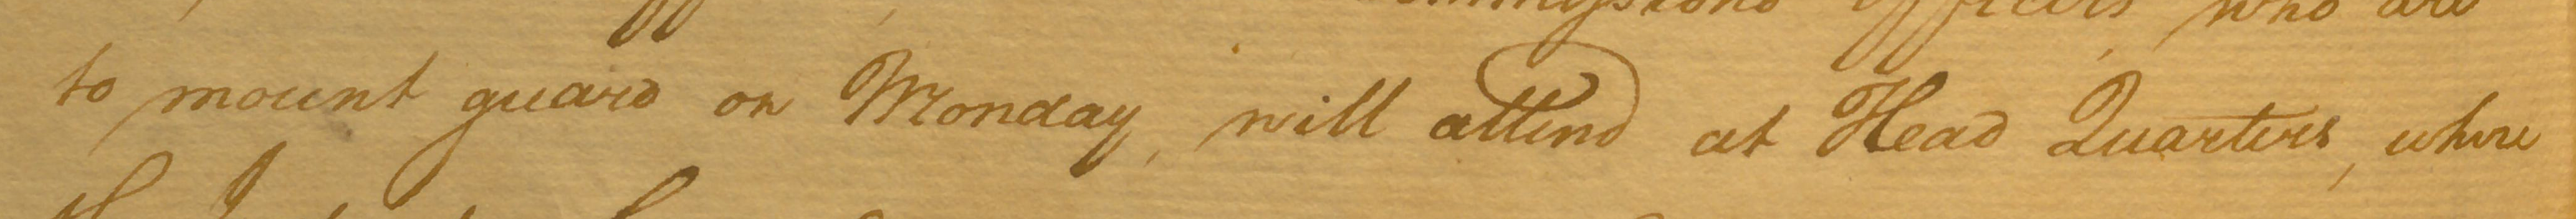to mount guards on Monday, will attend at Head Quarters, where
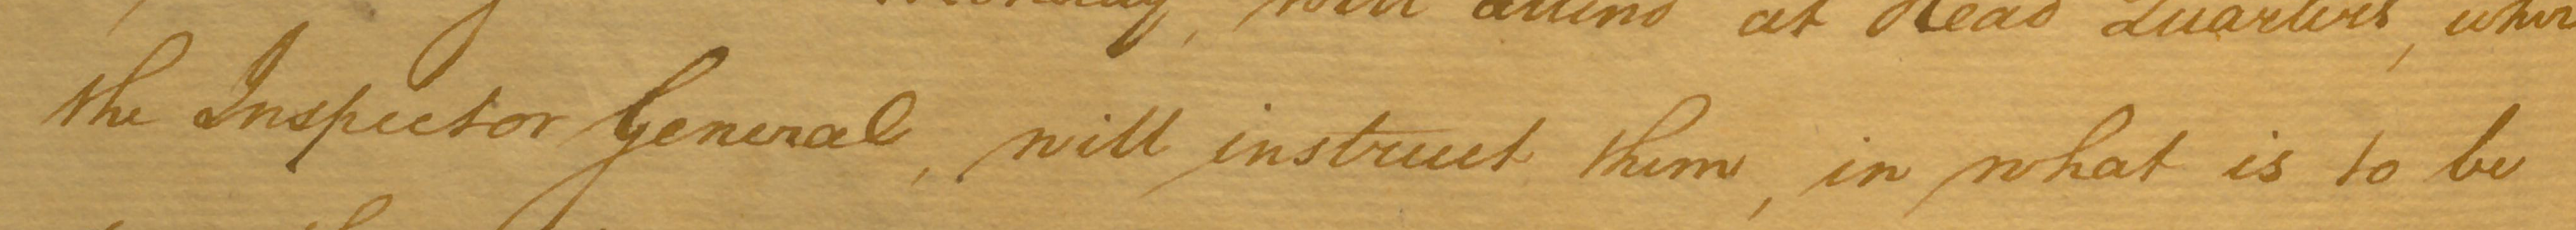the Inspector General will instruct them, in what is to be
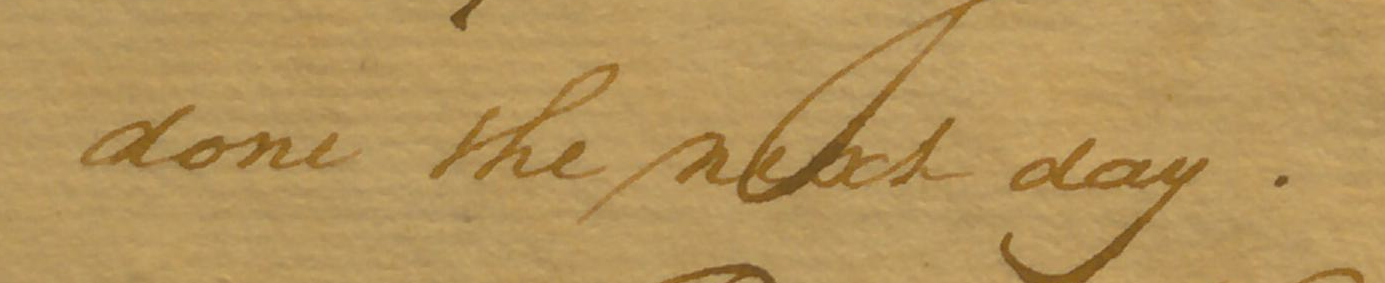done the next day.
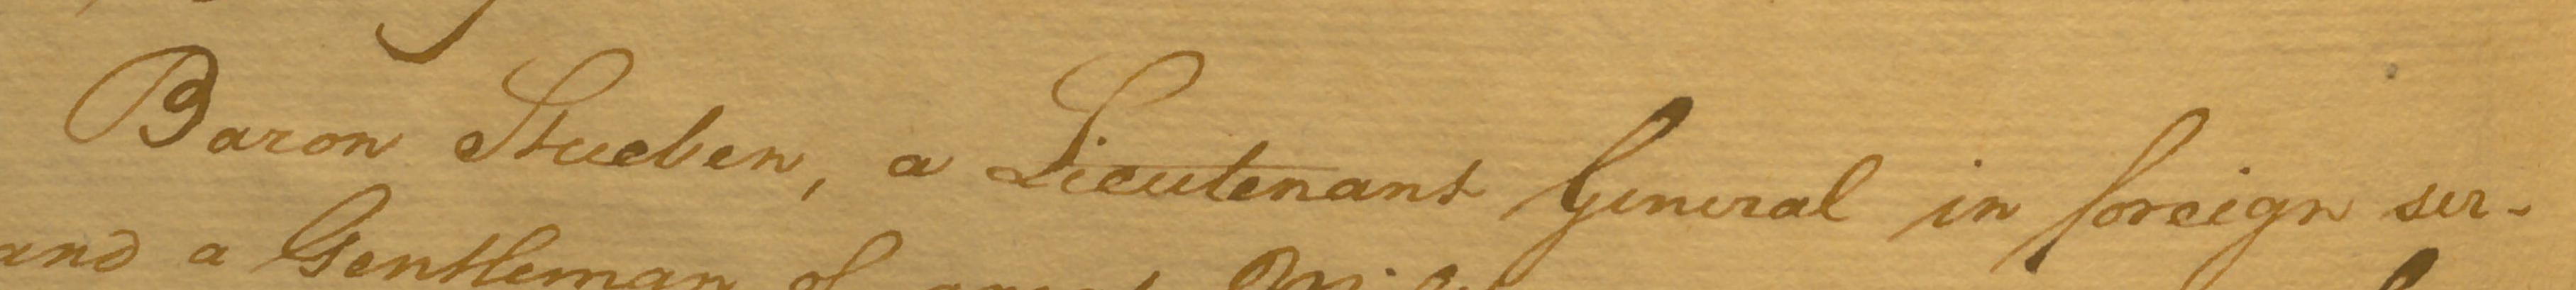Baron Stueben, a Lieutenant General in foreign ser-
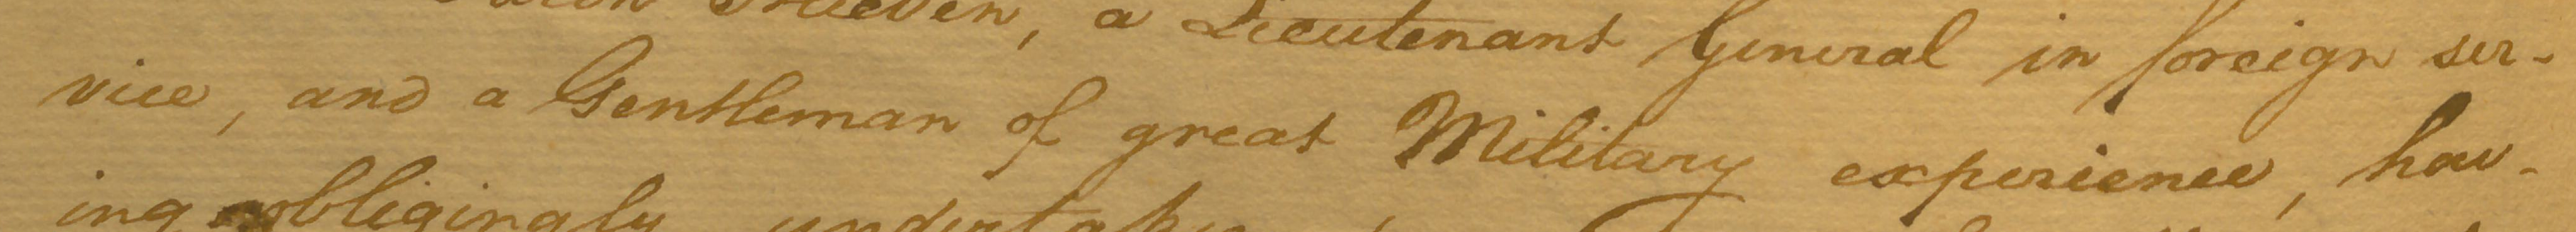vice, and a Gentleman of great Military experience, hav-
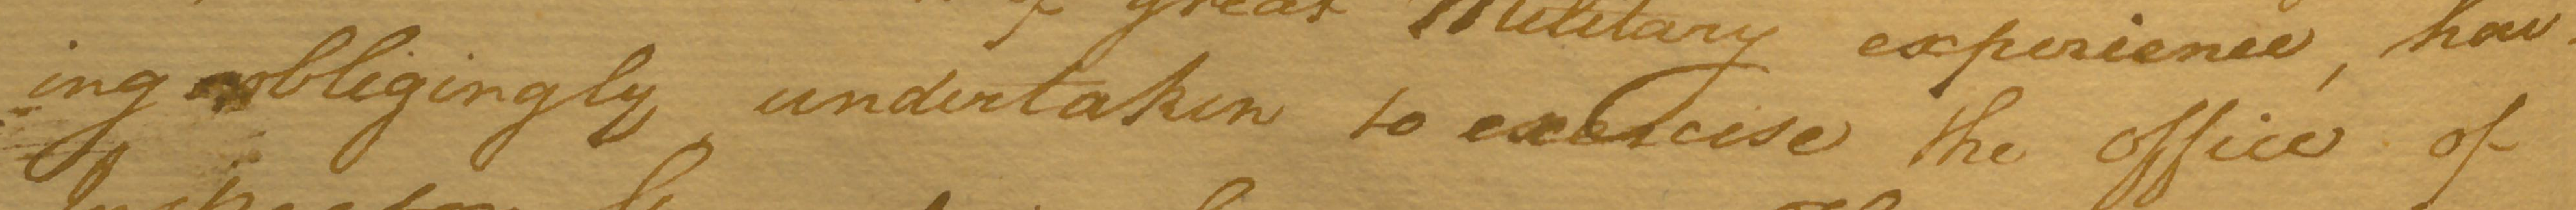ing obligingly undertaken to exercise the office of
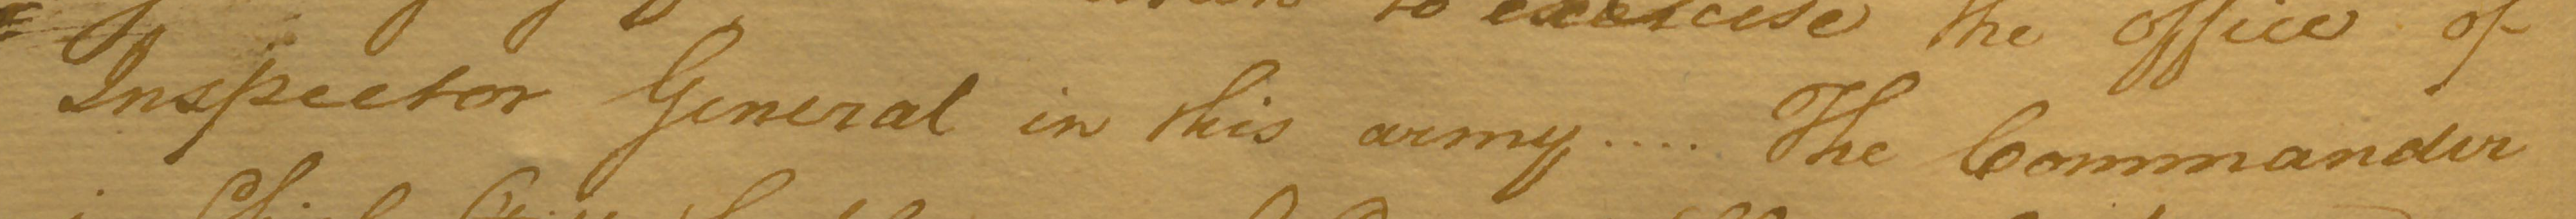Inspector General in this army.... The Commander
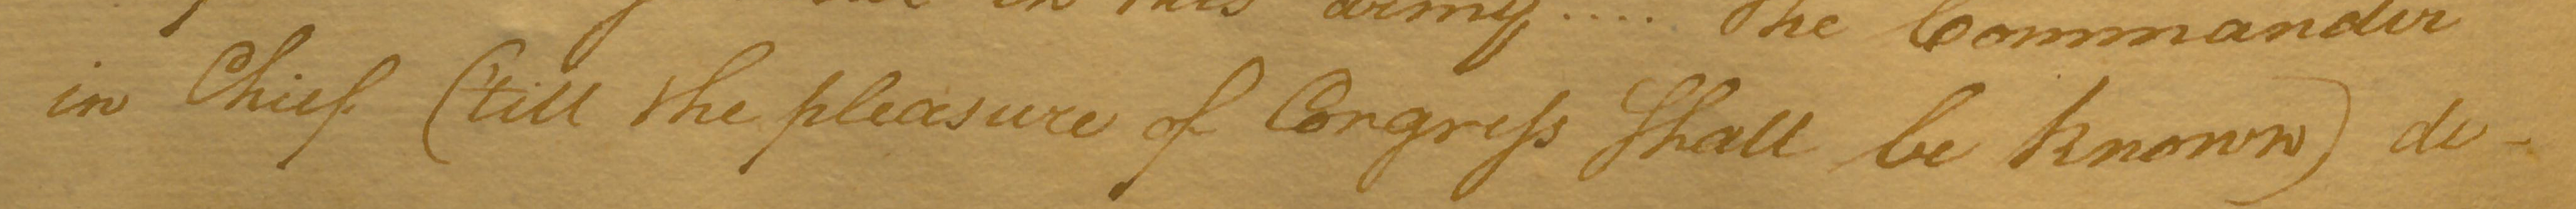in Chief ('till the pleasure of Congress shall be known) de-
